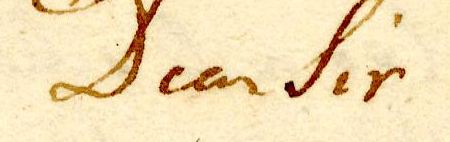Dear Sir
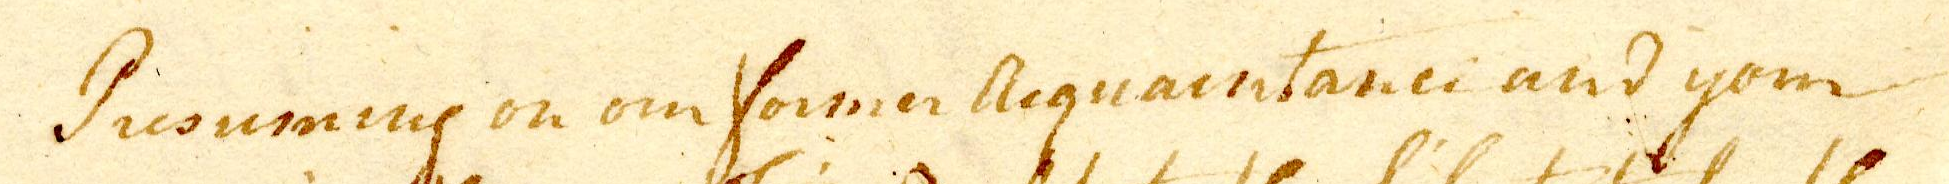Presuming on our former Acquaintance and your
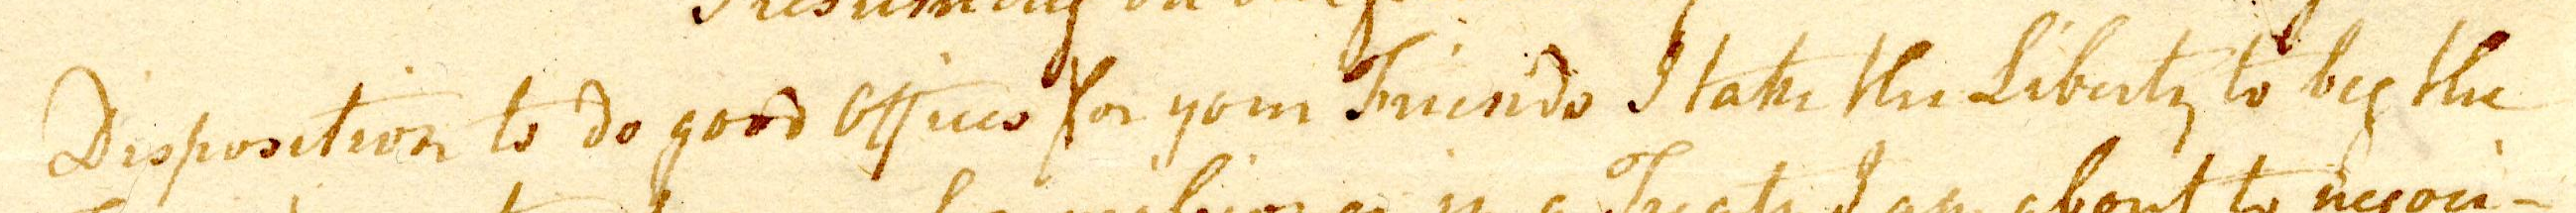Disposition to do good Offices for you Friends I take the Liberty to beg the
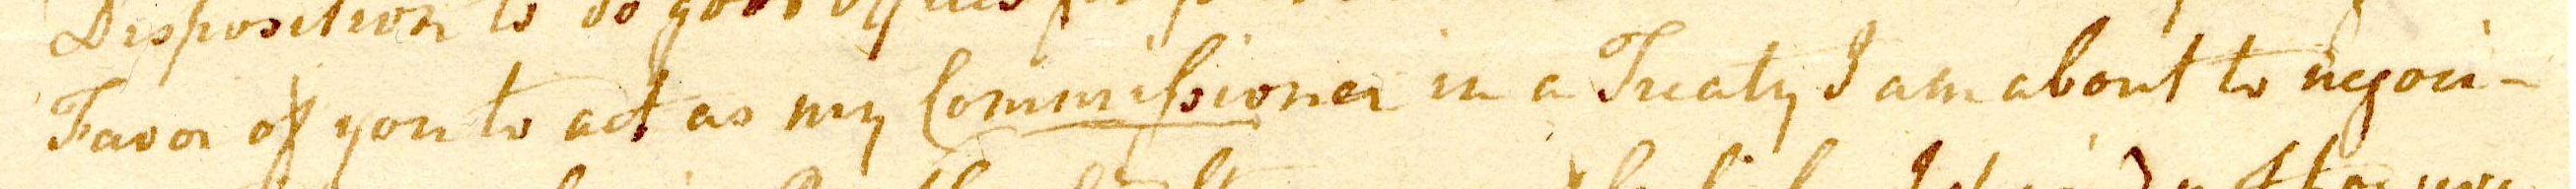Favor of you to act as my Commissioner in a Treaty I am about to negoti-
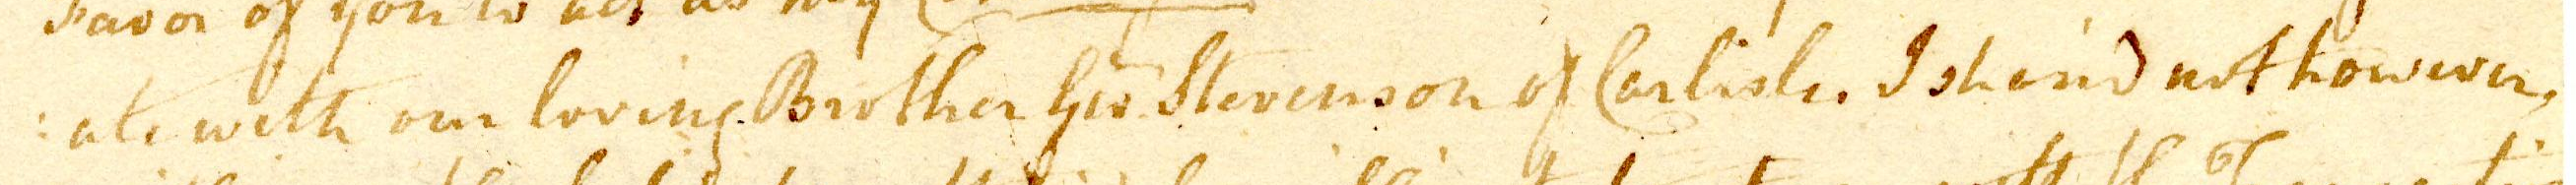-ate with our loving Brother Geo. Stevenson of Carlisle. I shand not however
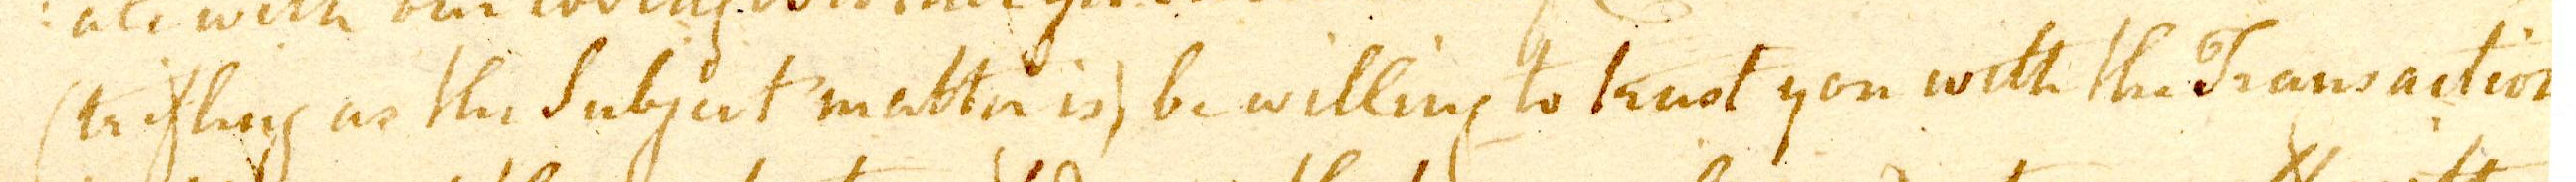(trifling as the Subject matter is) be willing to trust you with the Transaction
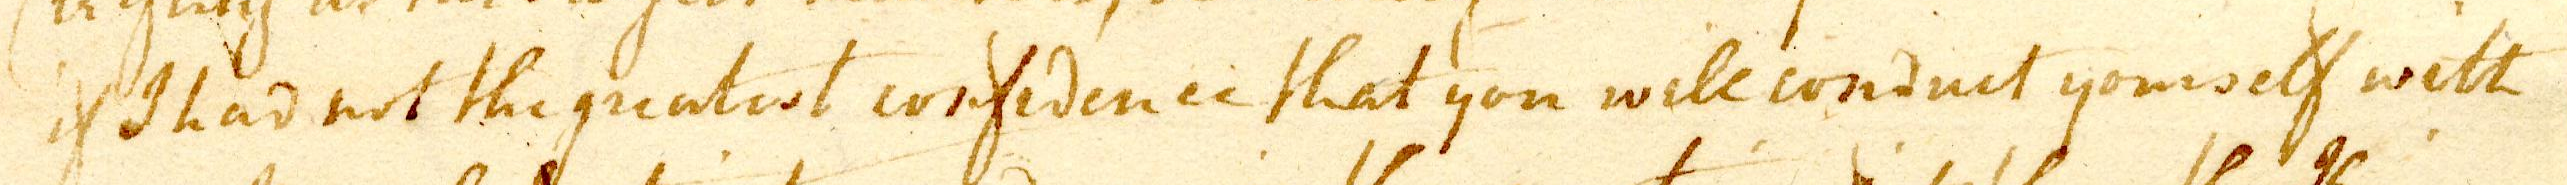if I had not the greatest confidence that you well conduct yourself with
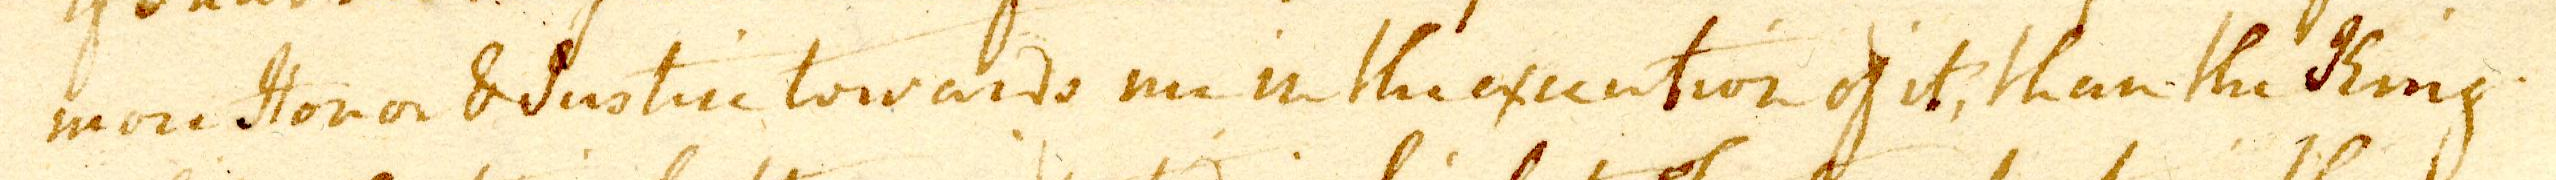more Honor & Justice towards me in the execution of it, than the King
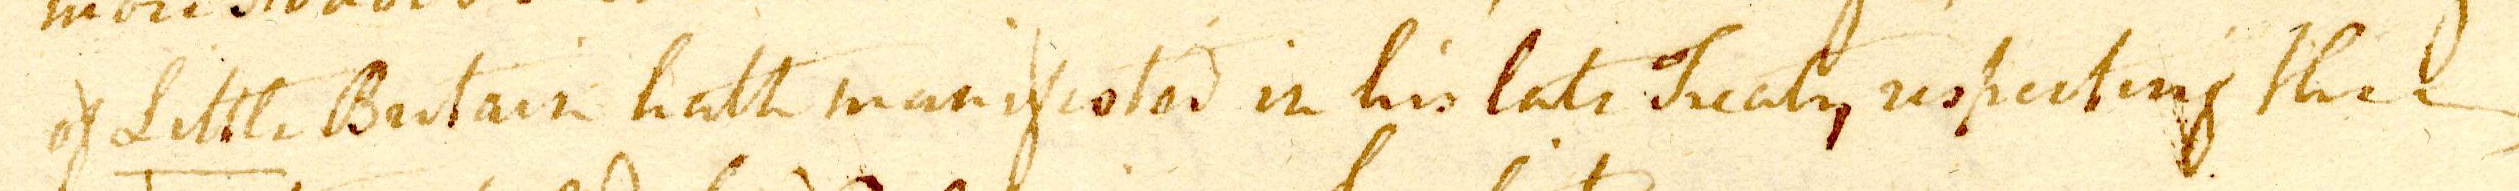of Little Britain hath manifested in his late Treaty respecting the
